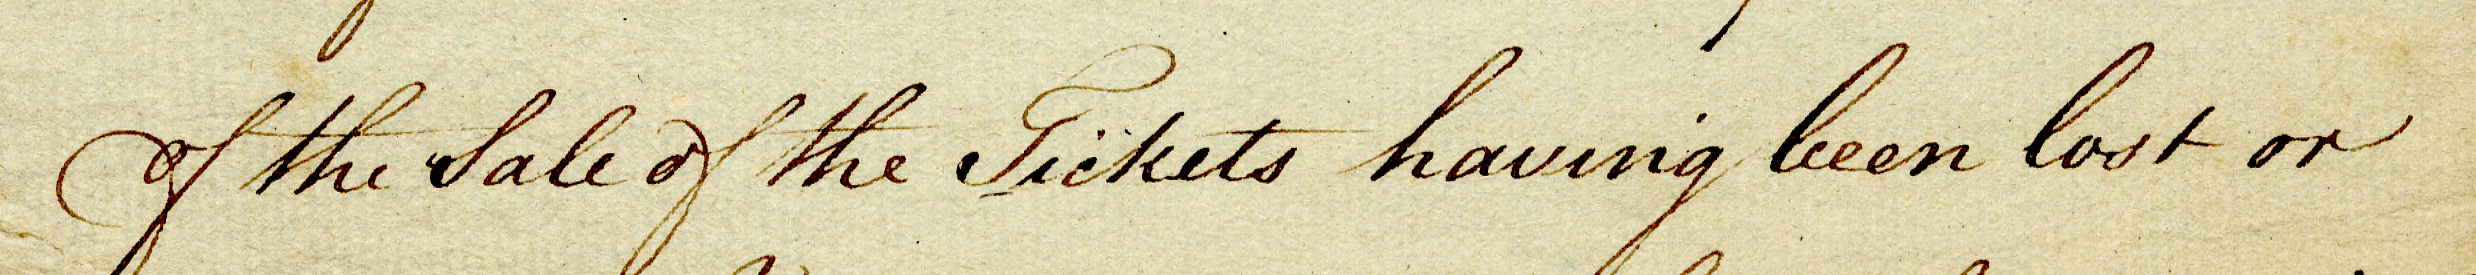of the Sale of the Tickets having been lost or
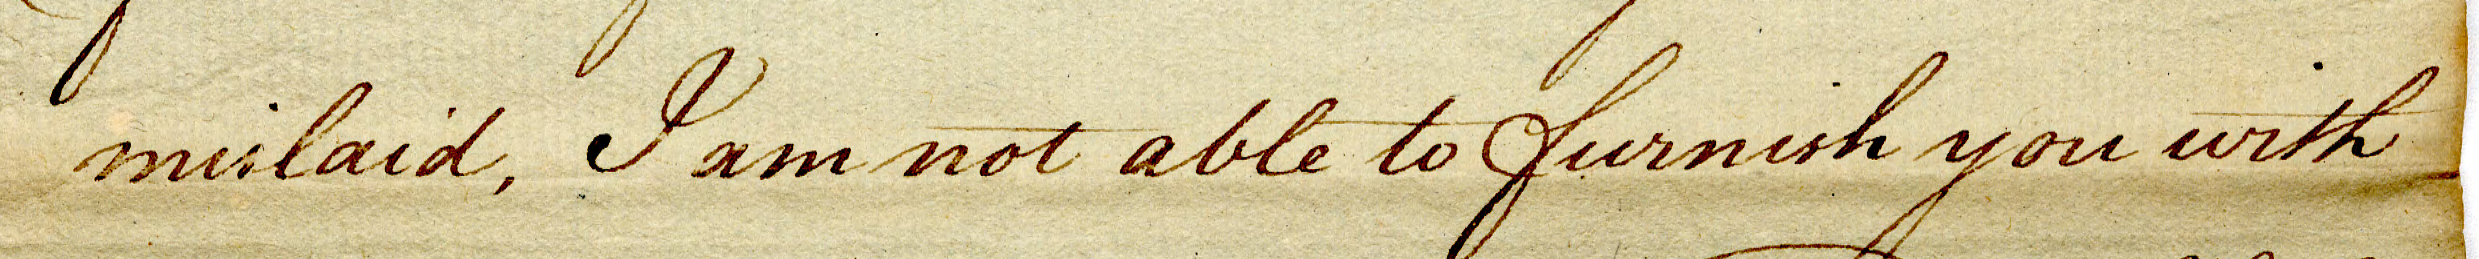mislaid, I am not able to furnish you with
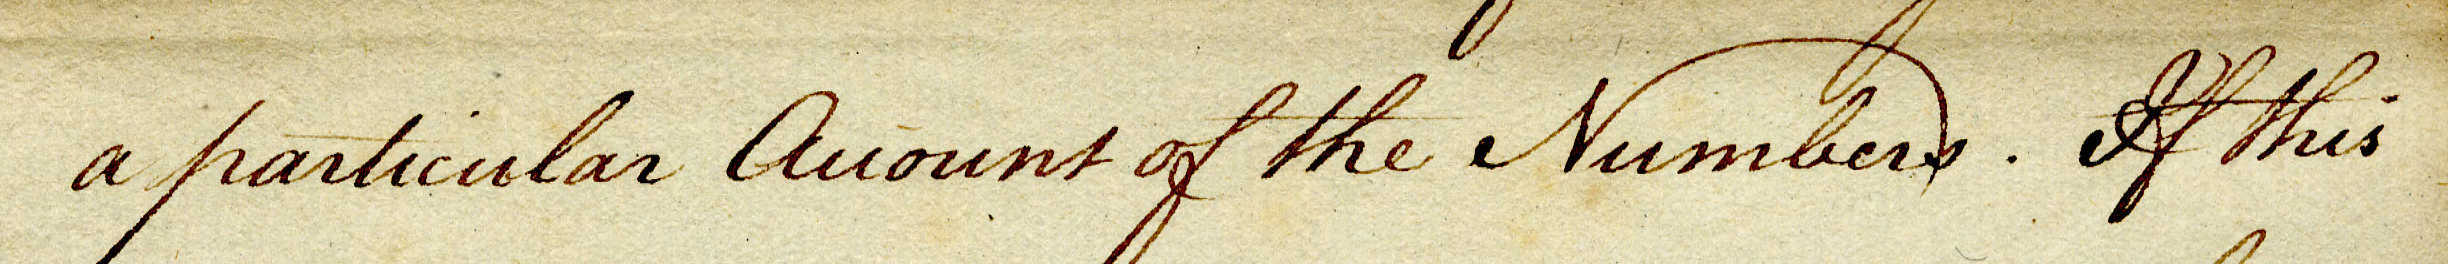a particular Account of the Numbers. If this
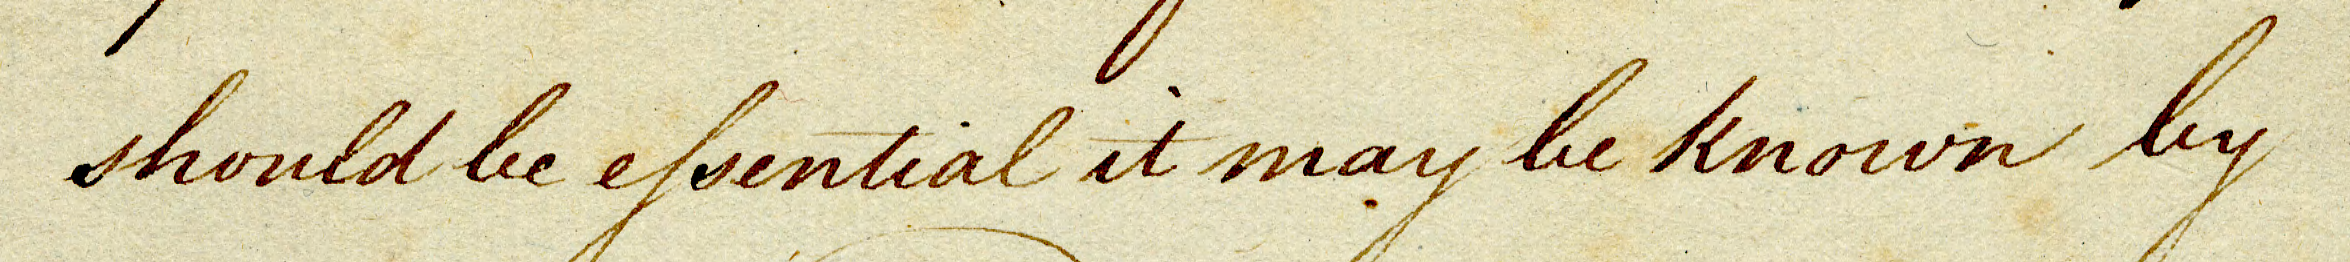should be essential it may be known by
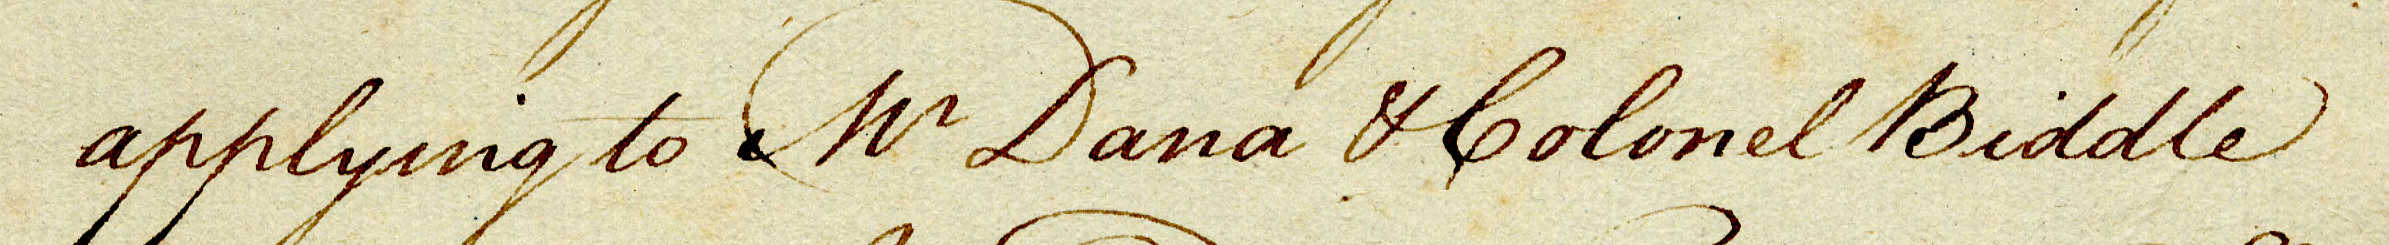applying to M^r Dana & Colonel Biddle
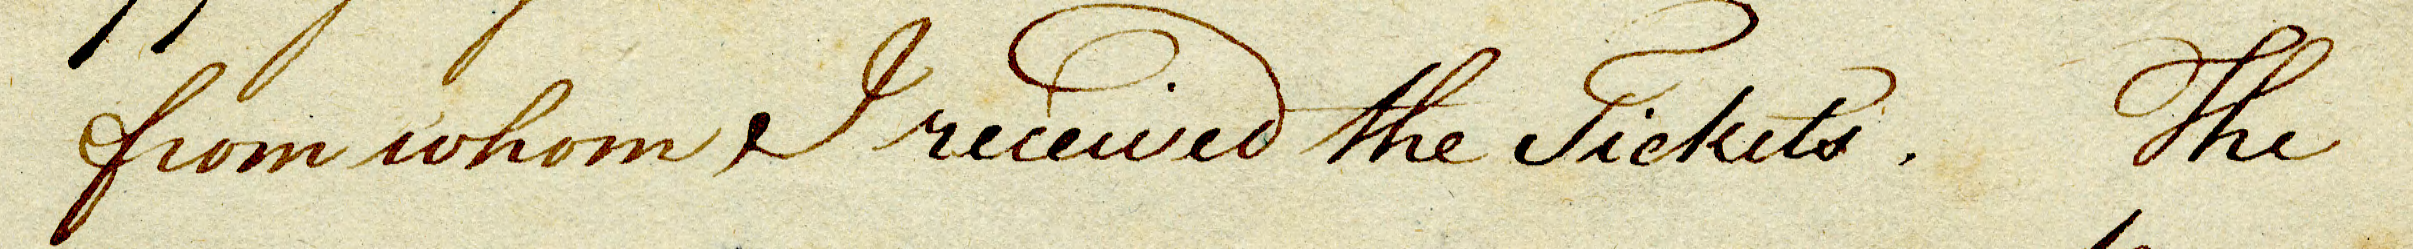from whom I received the Tickets. The
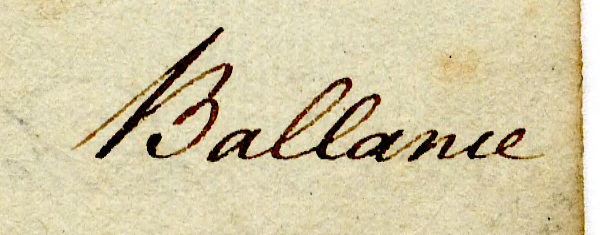Ballance
